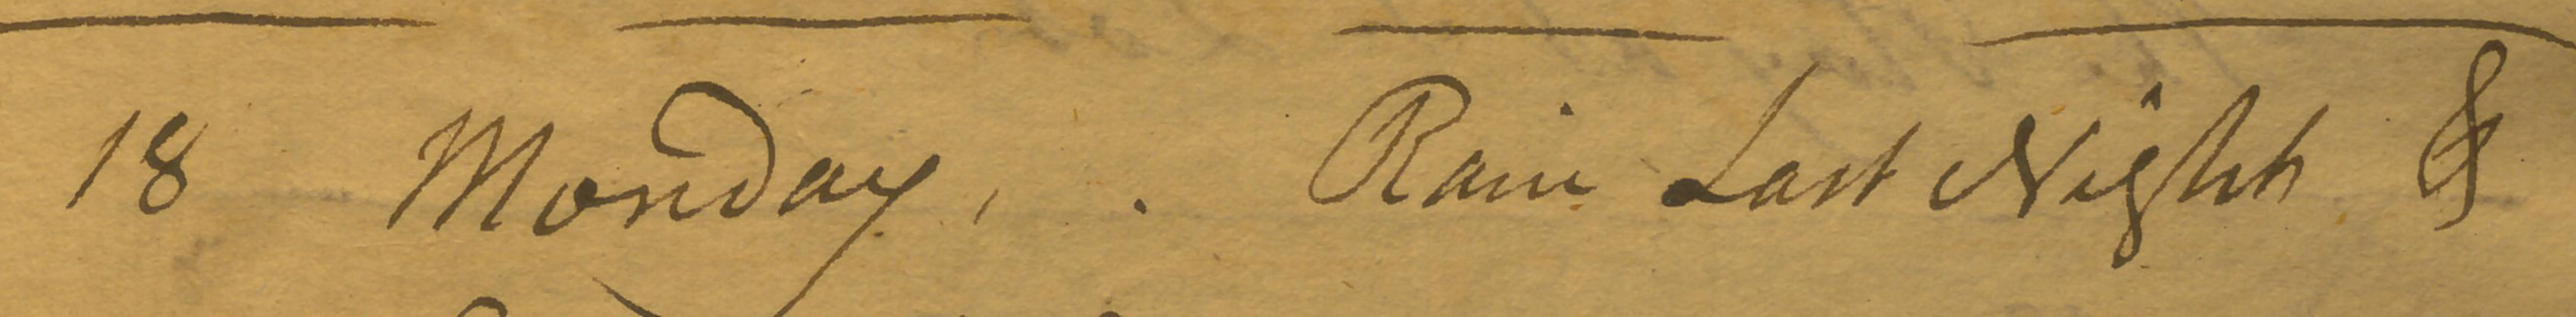18 Monday. Rain Last Night &
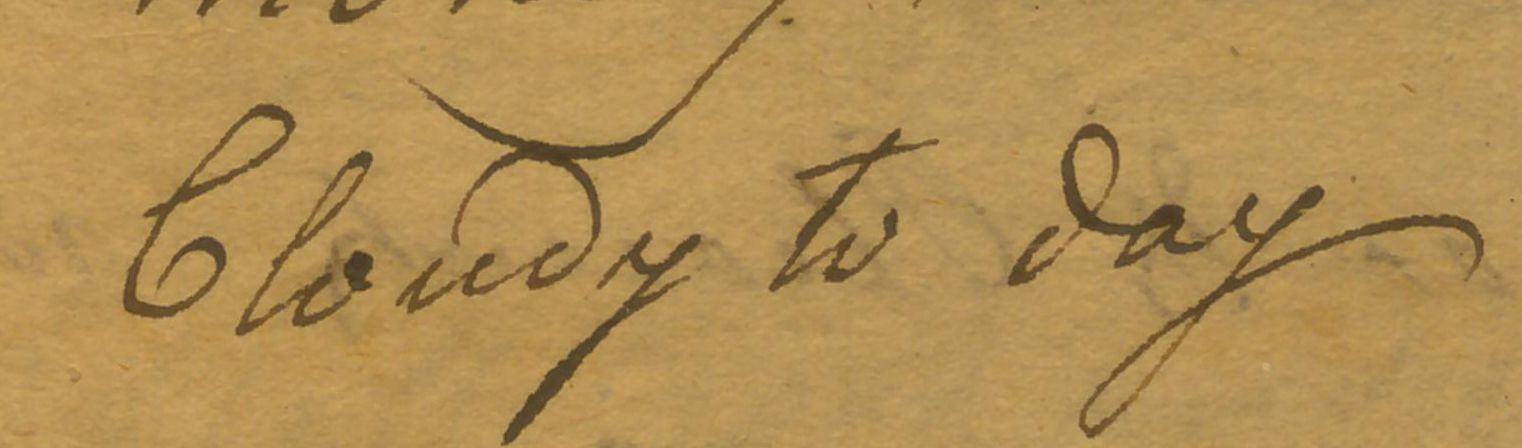Cloudy to day
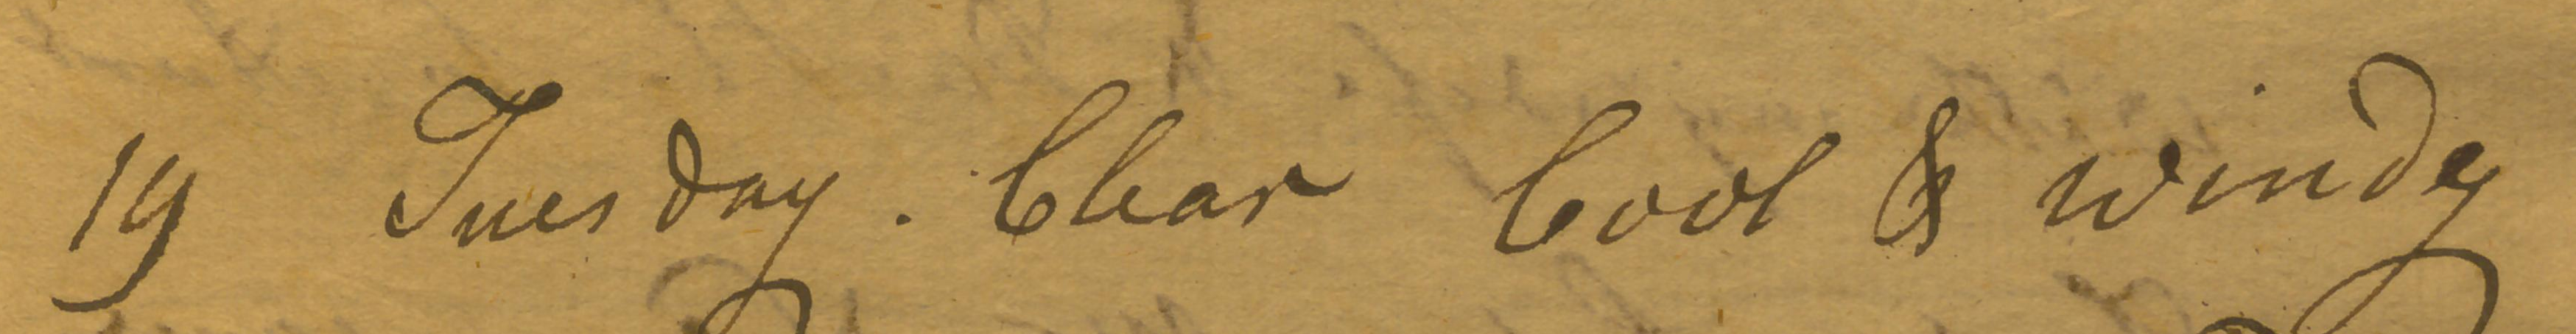19 Tuesday. Clear Cool & windy
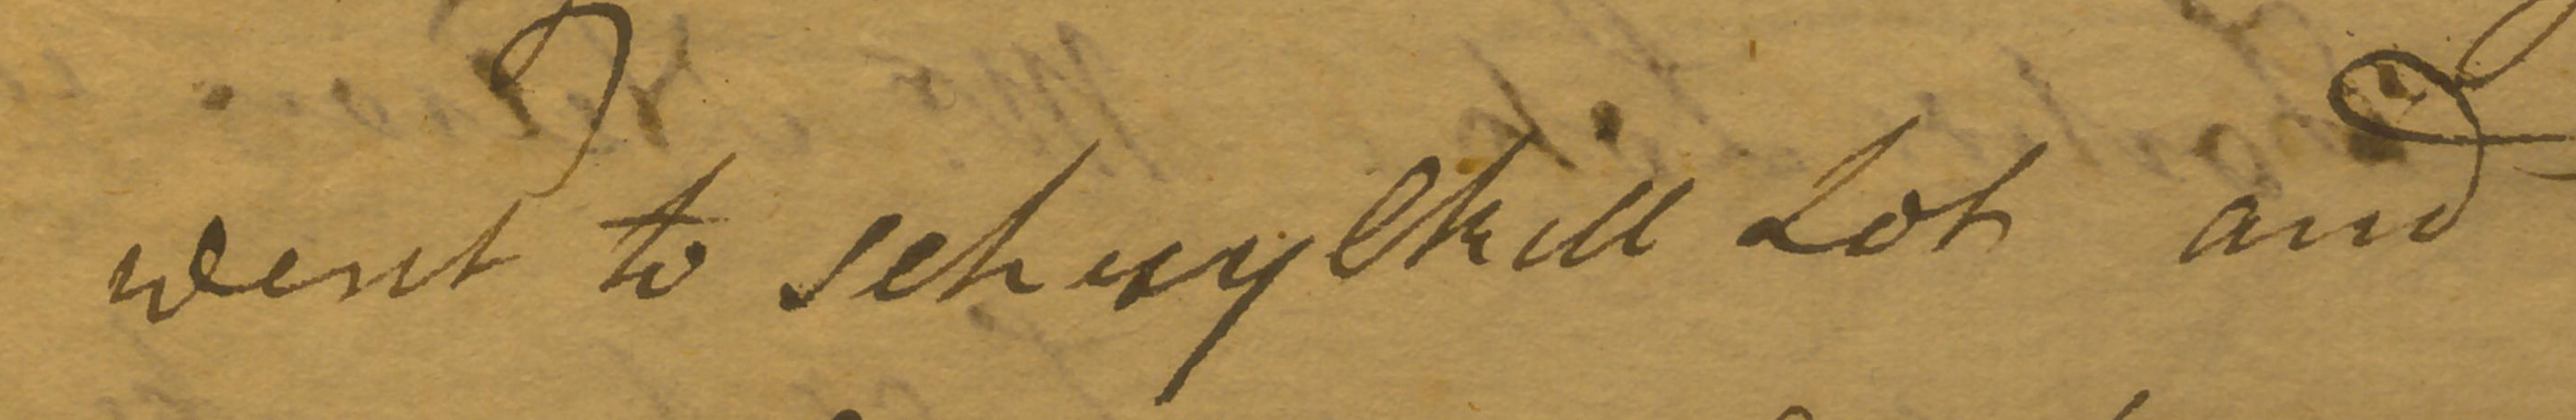went to schuylkill Lot and
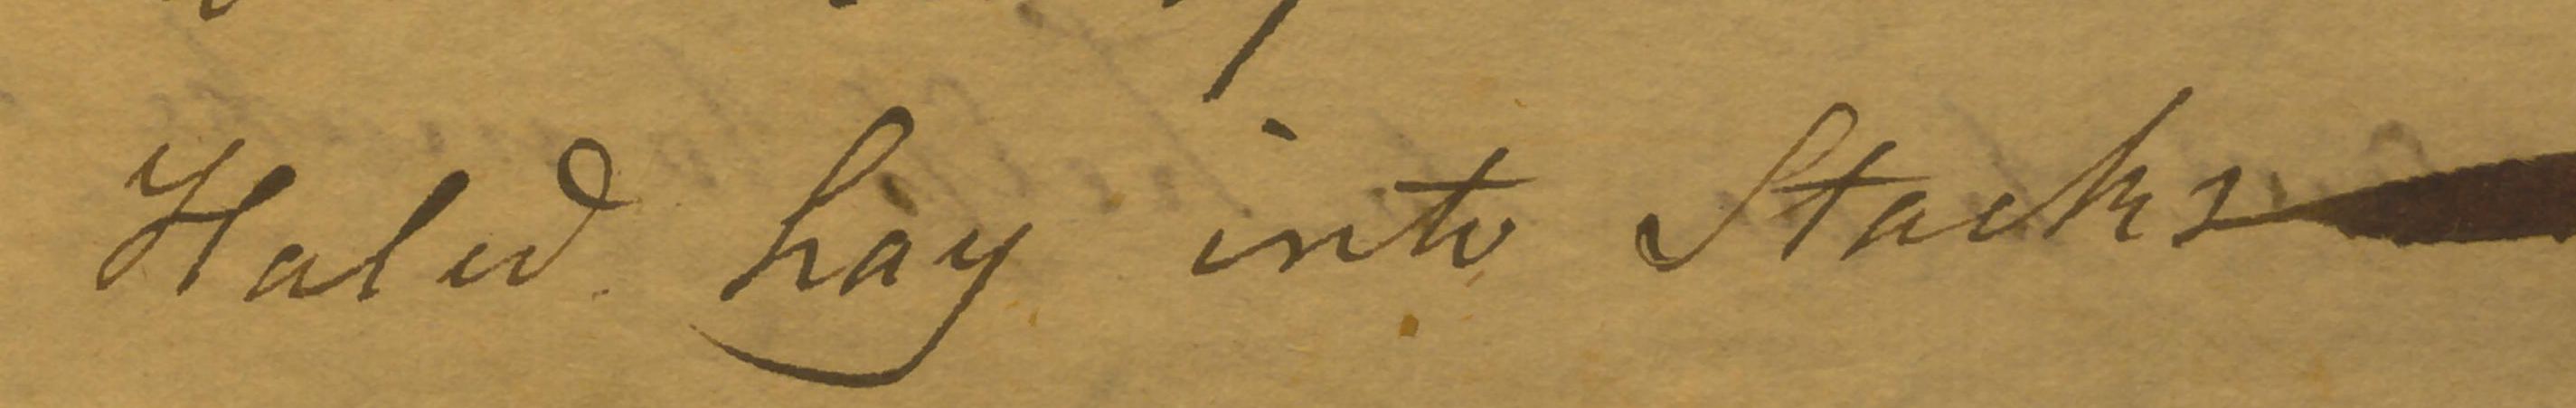Haled hay into Stacks
